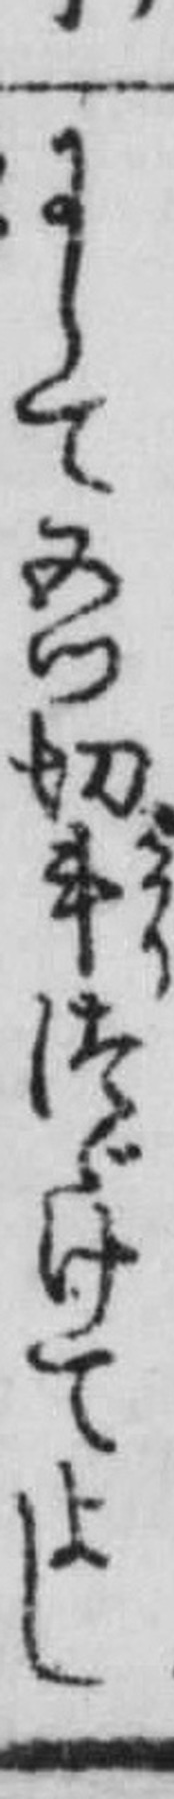にして五つ切斗つゞけてよし
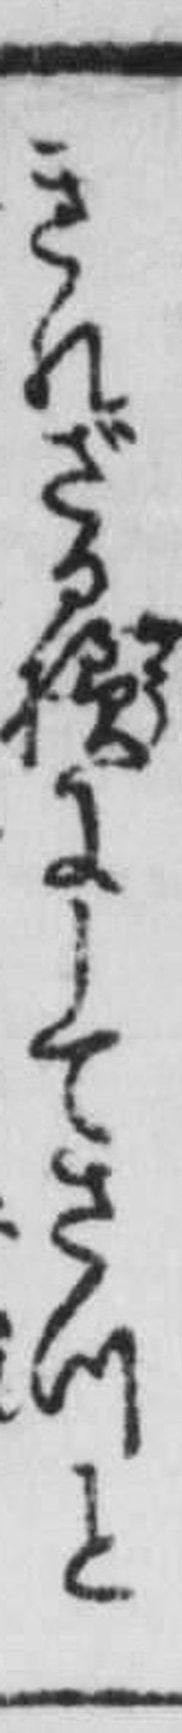きれざる様にしてさつと
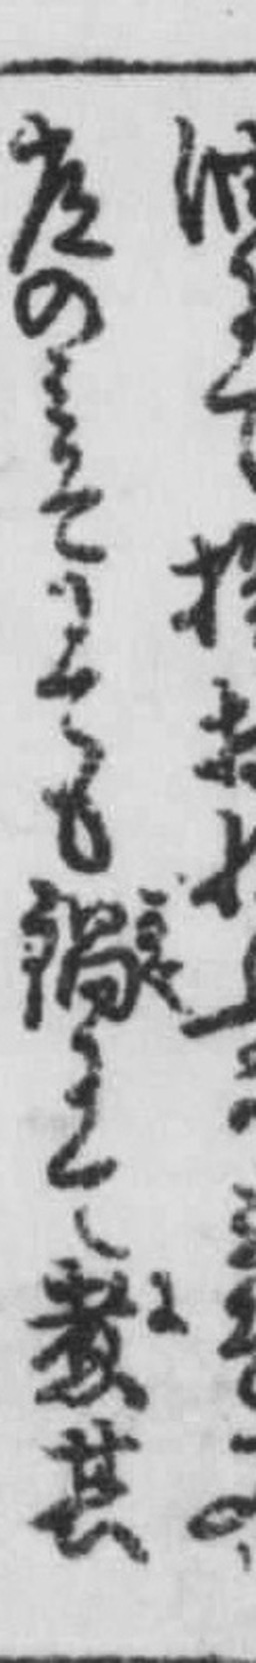常のみそにても鍋にて煮其
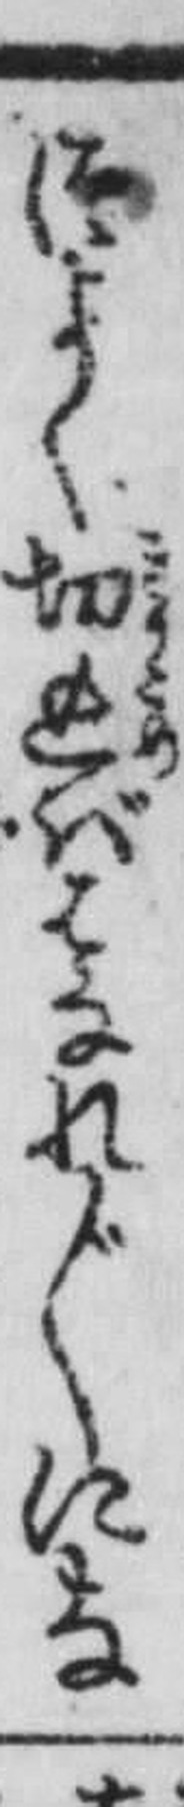つよく切込ばはなれ〴〵にな
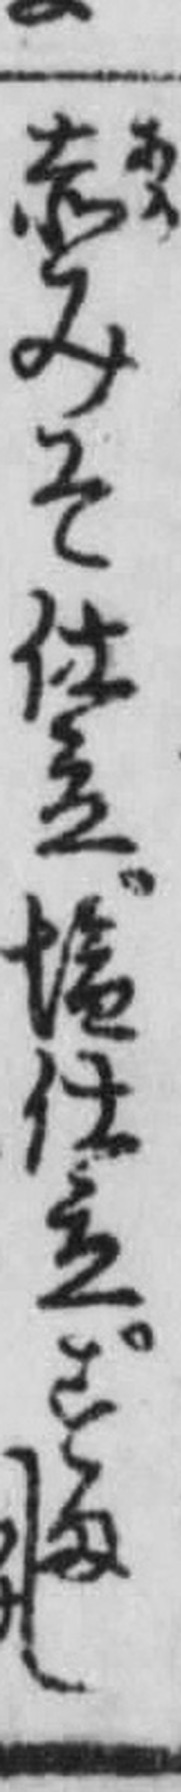赤みそ仕立。塩仕立。すまし
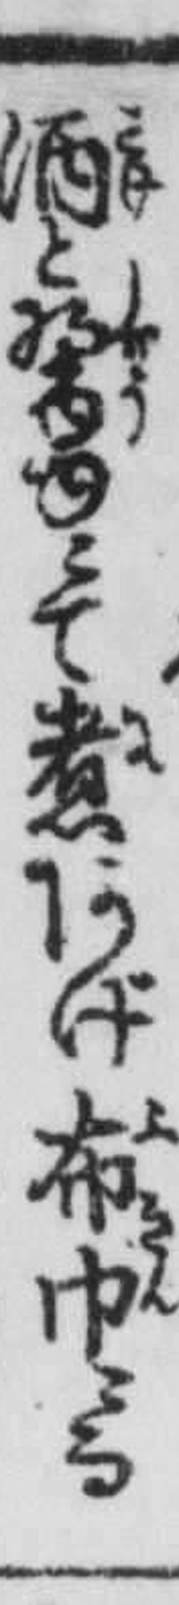酒と醤ゆにて煮あげ布巾にて
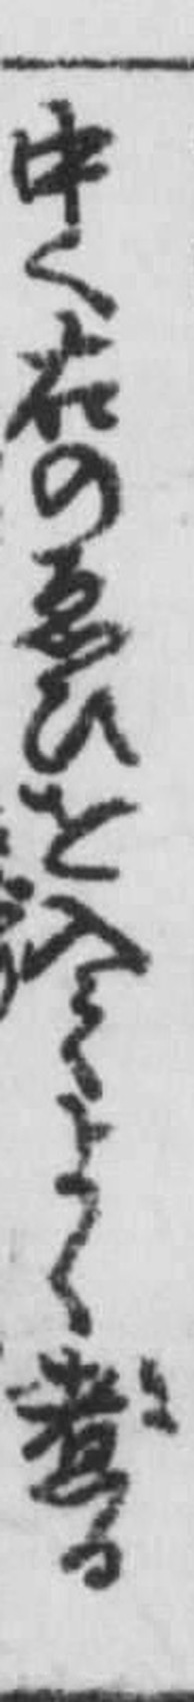中へ右のゑひを入てよく煮る
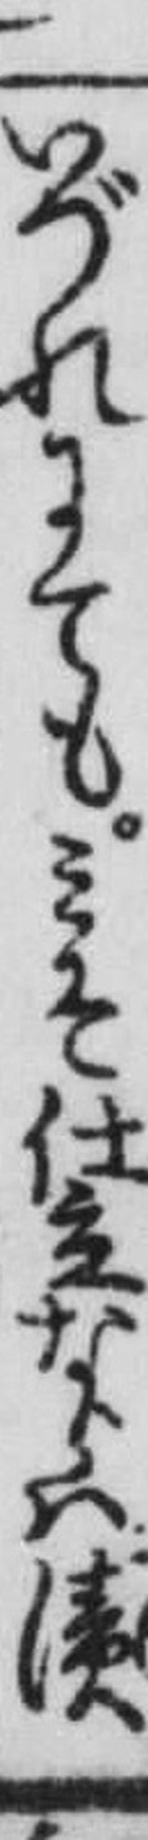いづれにても。みそ仕立ならは漬
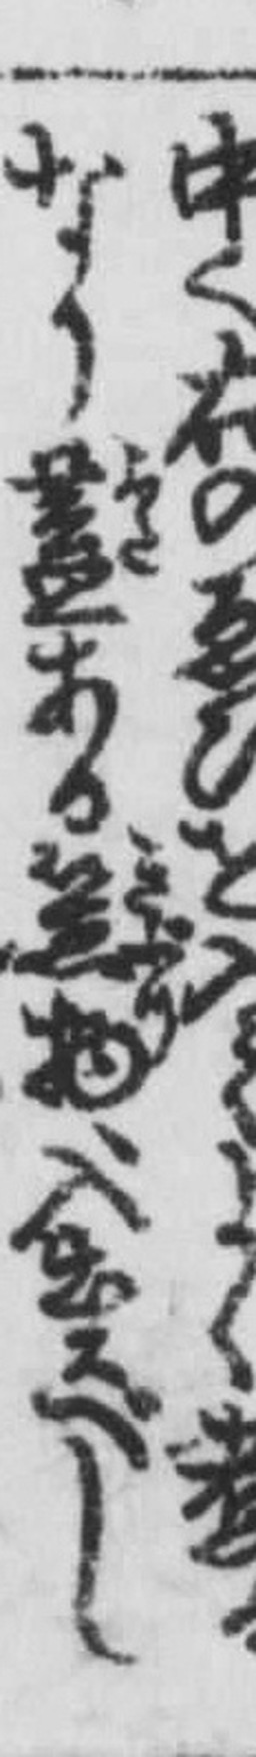なり蓋ある器物へ入出すべし
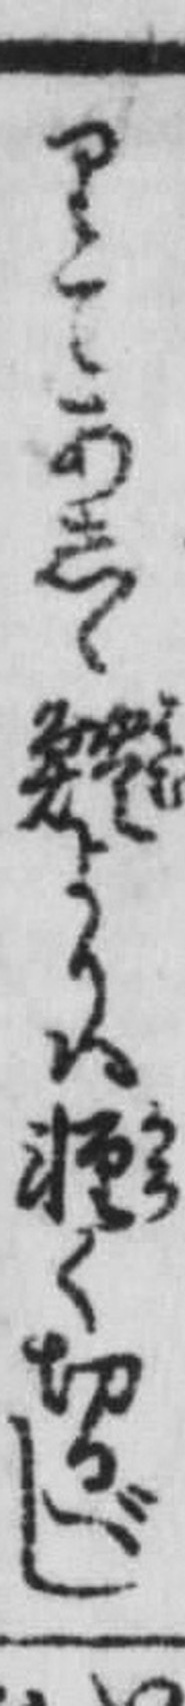りてあしく鱧よりは軽く切るべし
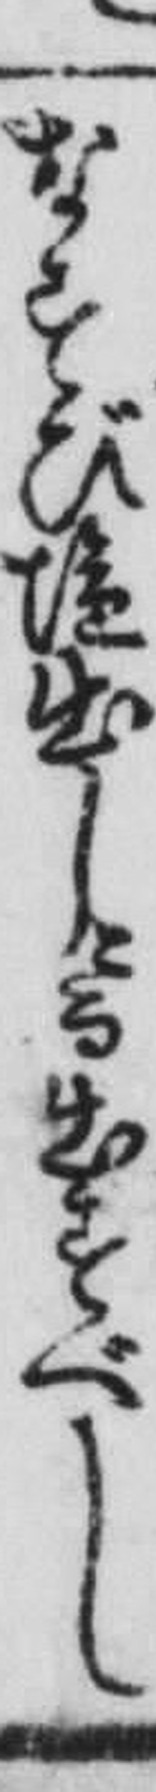なすび塩出したる出すべし
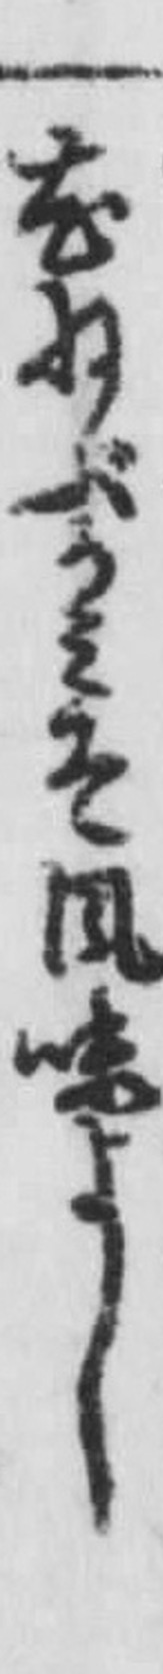尤ねぶかみそ風味よし
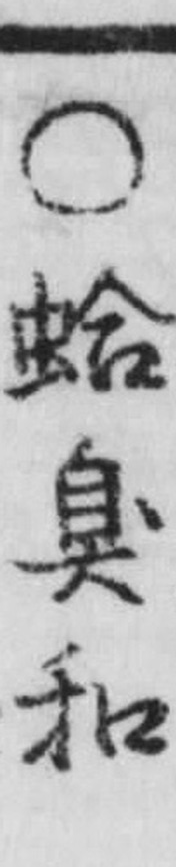○蛤臭和
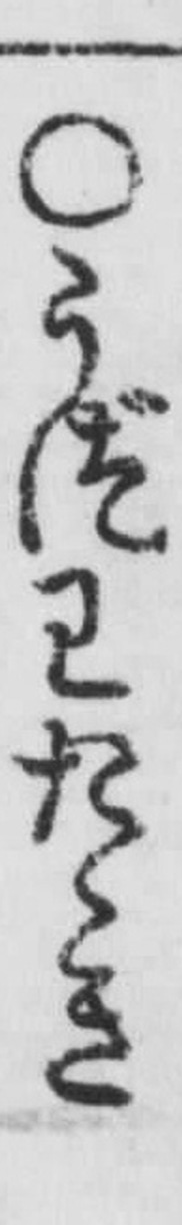○うづわたゝき
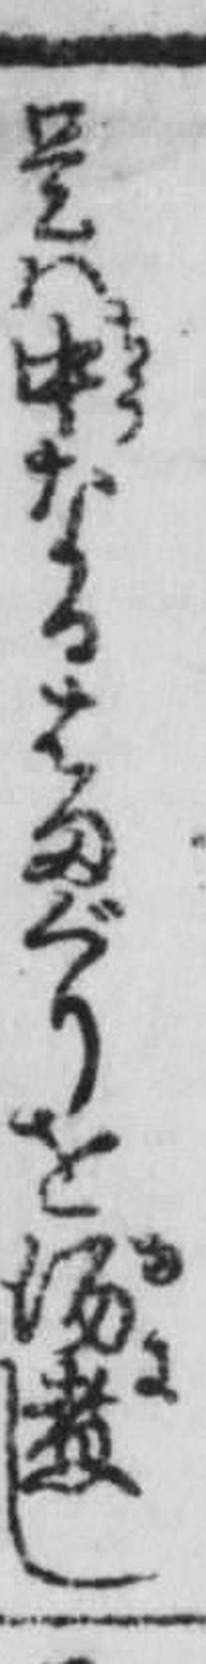是は中なるはまぐりを湯煮し
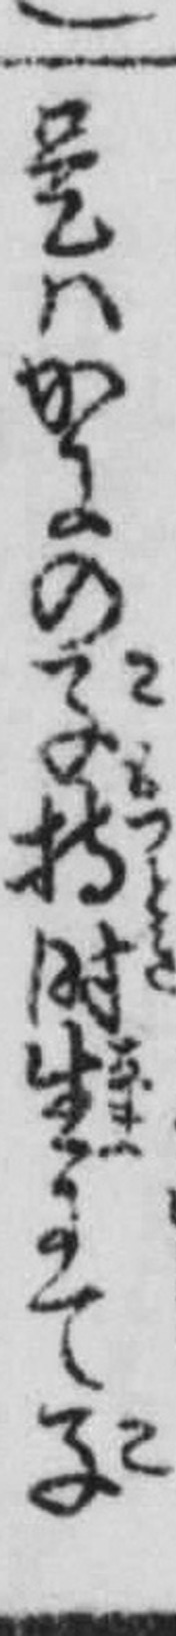是はかにの子持時生にて子
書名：精進魚類間合料理/早速庖丁
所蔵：大阪府立大学学術情報センター 国文学研究資料館
